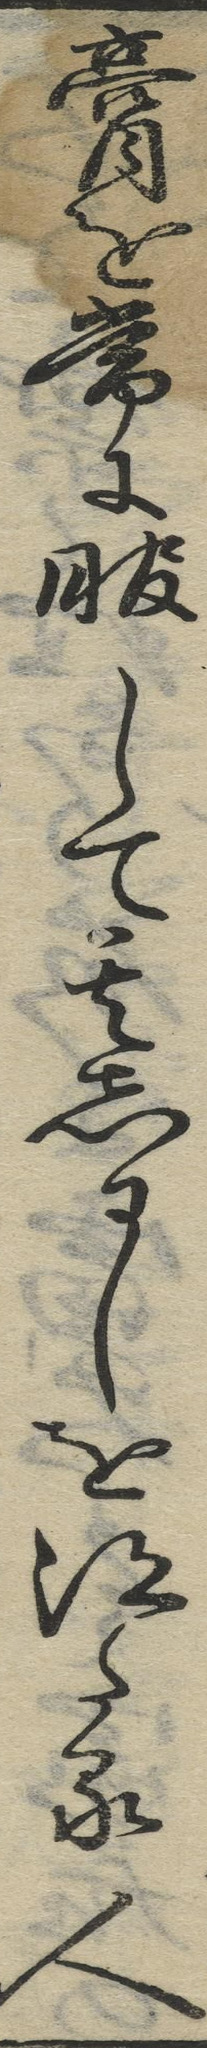膏を常に服して其しるしを跡たる人
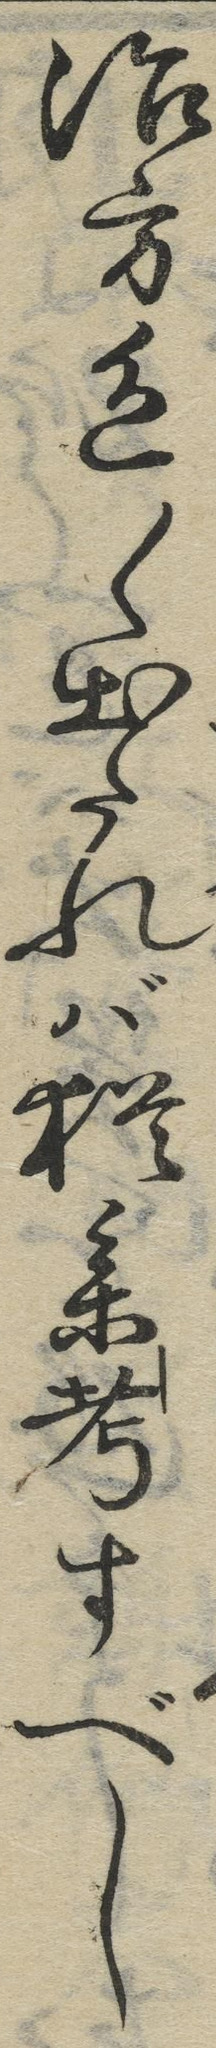治方色〳〵出たれバ猶参ノ考すべし
